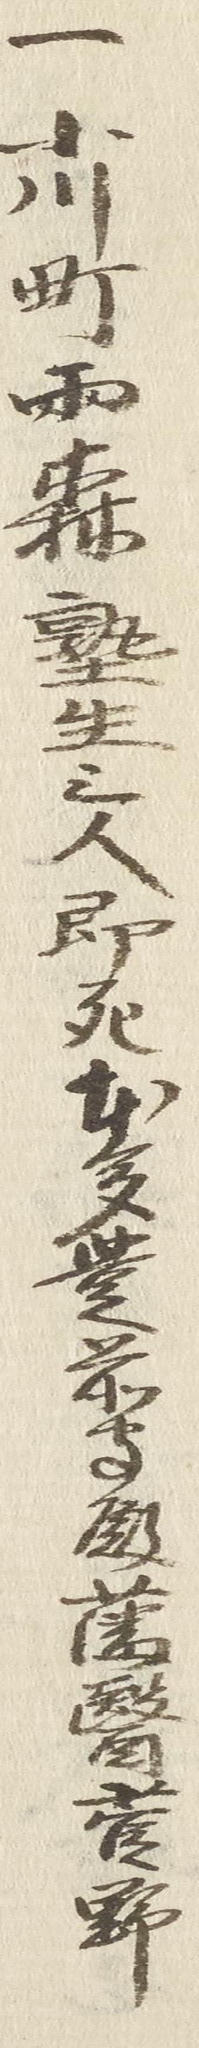一小川町雨森塾生三人即死本多豊前守殿藩医菅野
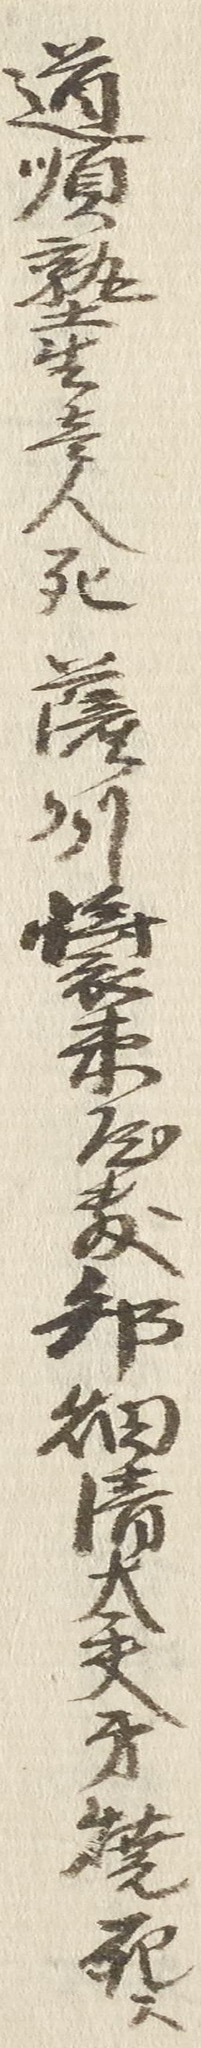道順塾生壱人死薩州装束屋敷邦畑清太夫弟焼死ス
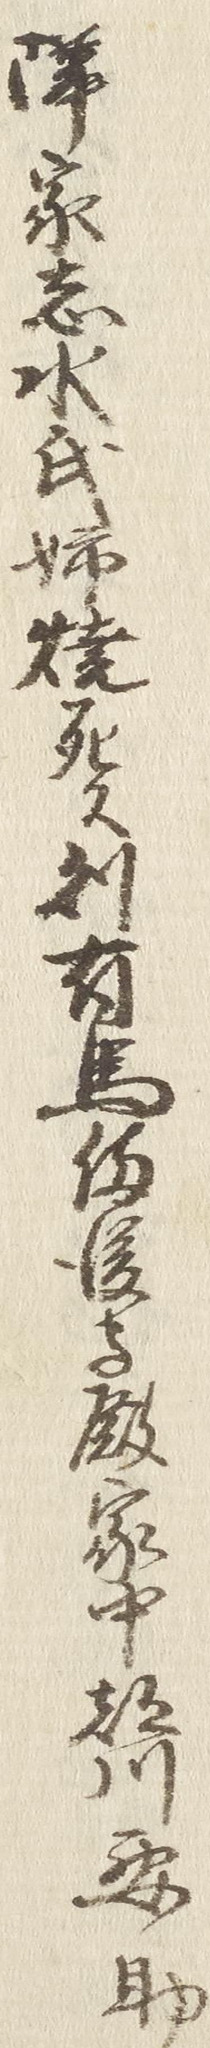隣家志水氏姉焼死ス則有馬備後守殿家中朝川要助
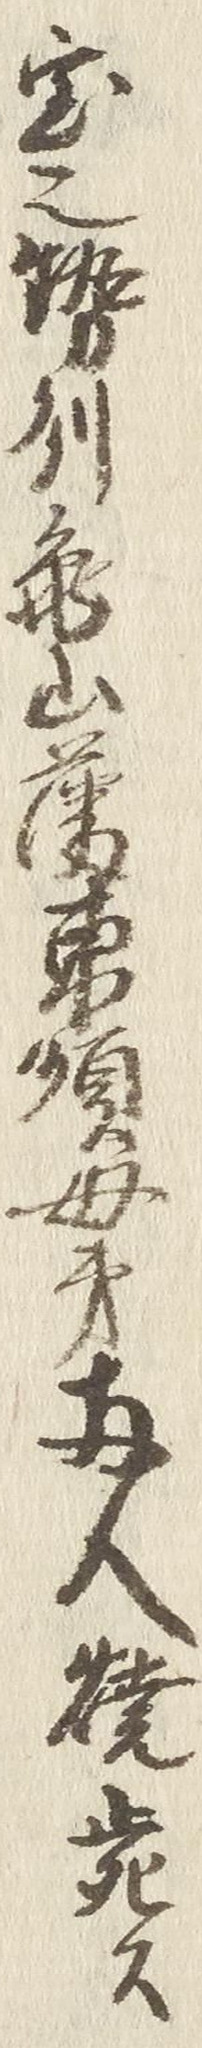室也勢州亀山藩東順母弟両人焼死ス
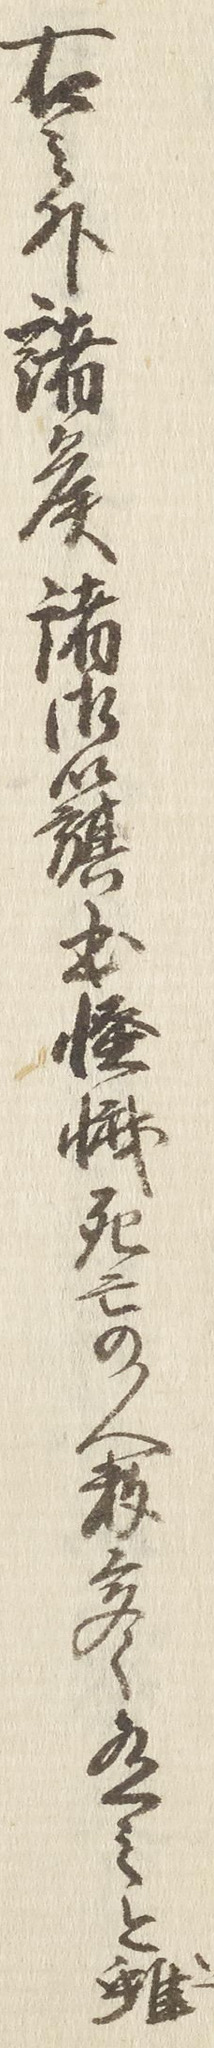右之外諸侯諸御籏本怪我死亡の人数多く有之と雖
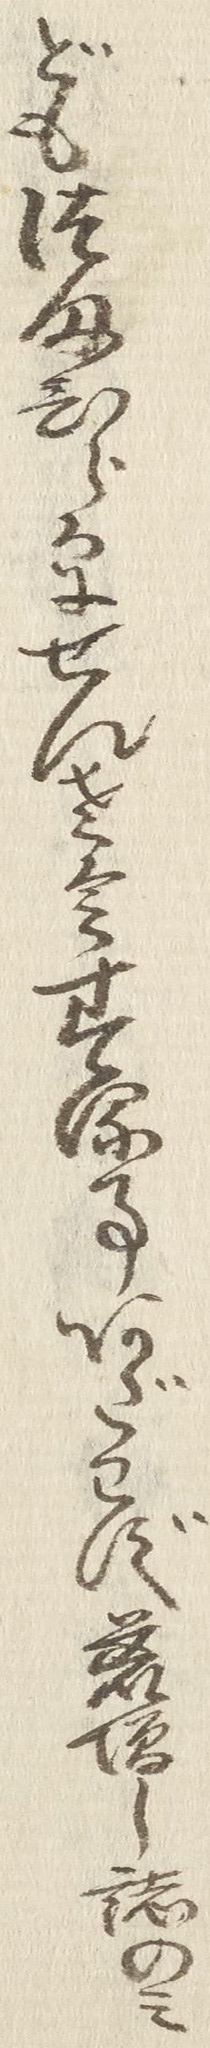どもつまひらかにせんさくする事あだわず荒増し諸のみ
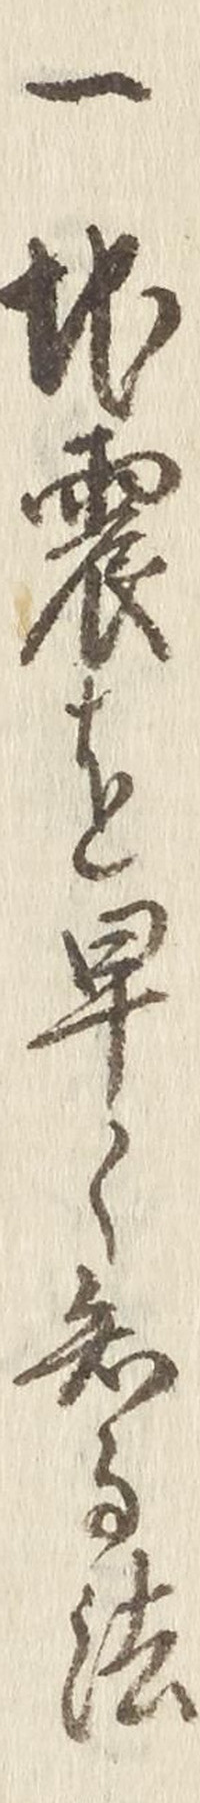一地震を早く知る法
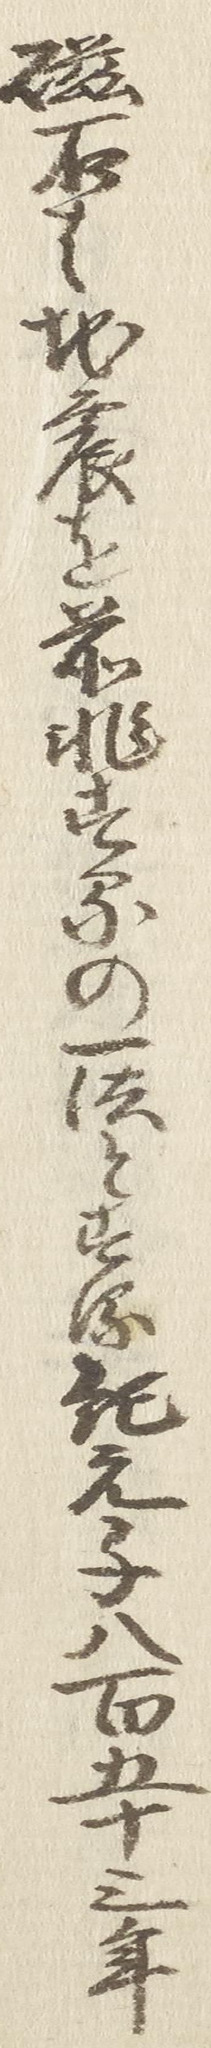磁石は地震を前兆するの一法とする紀元千八百五十三年
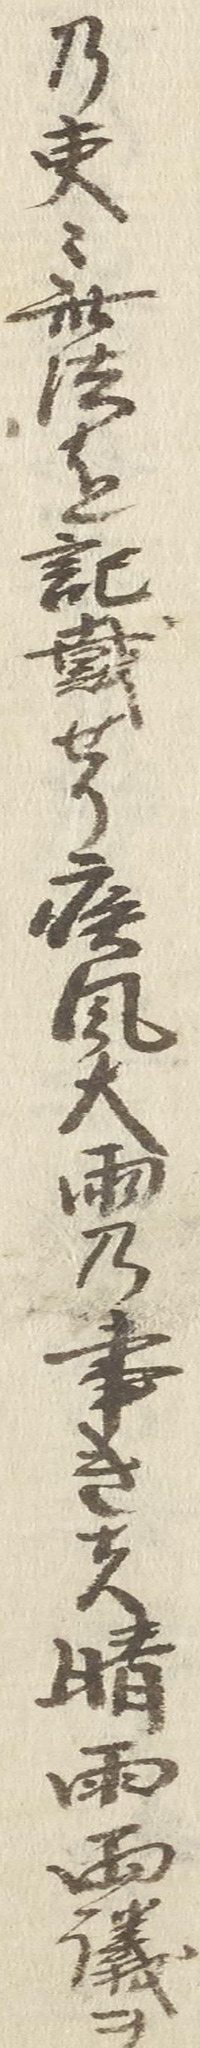の吏々此法を記載せり疾風大雨の事きは晴雨両議ヲ

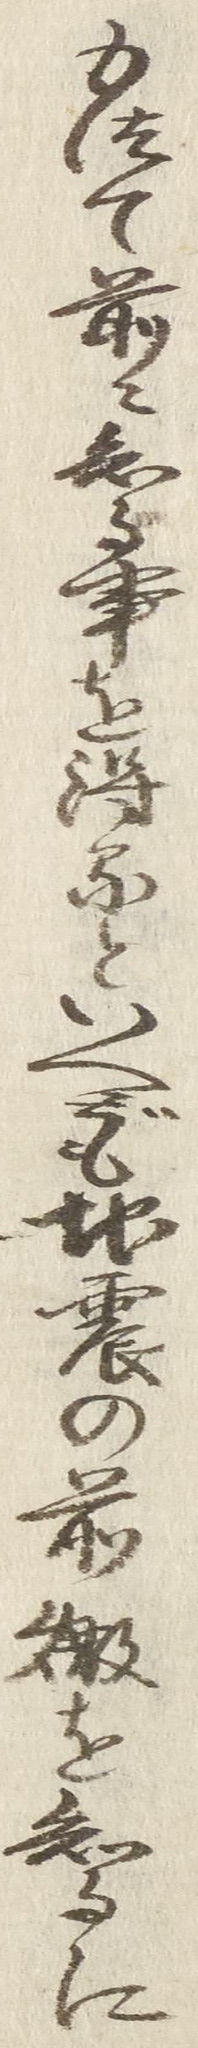もつて前ニ知る事を得るといへども地震の前徽を知るに
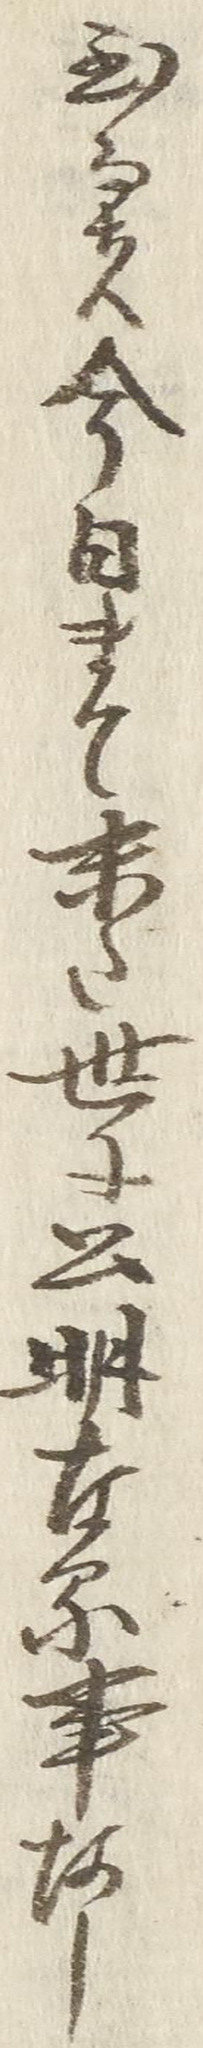至而は今日まて未た世に公明なる事なし
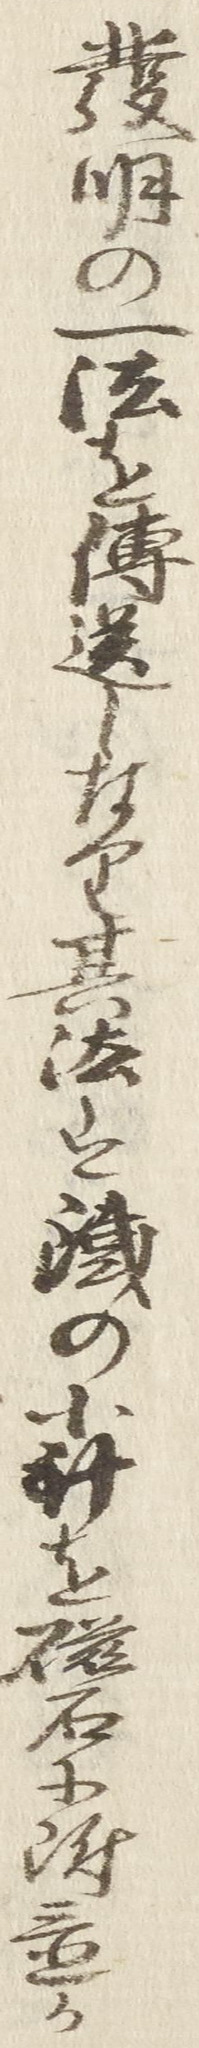発明の一法を伝送しなり其法は鉄の小針を磁石二附置か
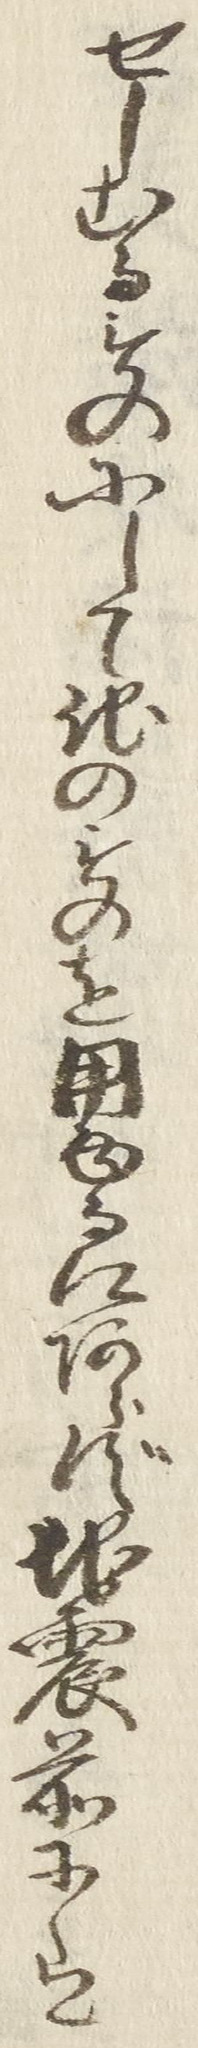せしむるものにして他のものを用ゆるにあらず地震前には
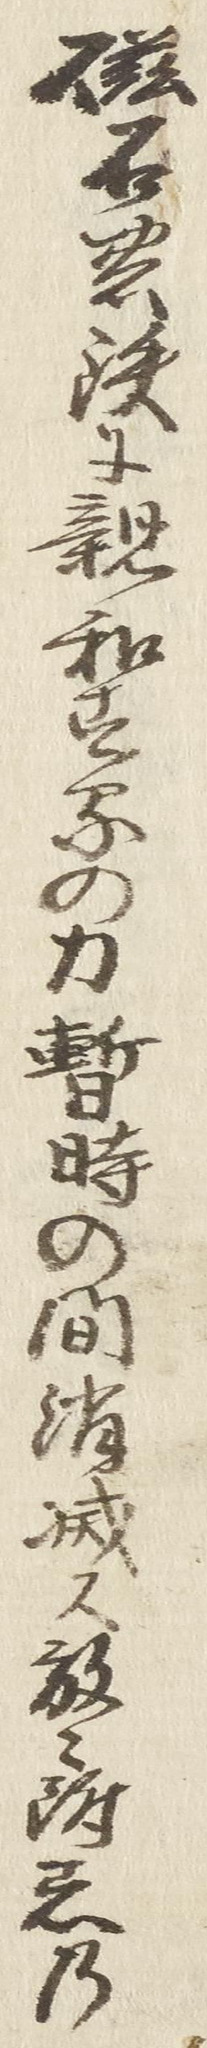磁石着鉄に親和するの力暫時の間消滅ス放々附着の
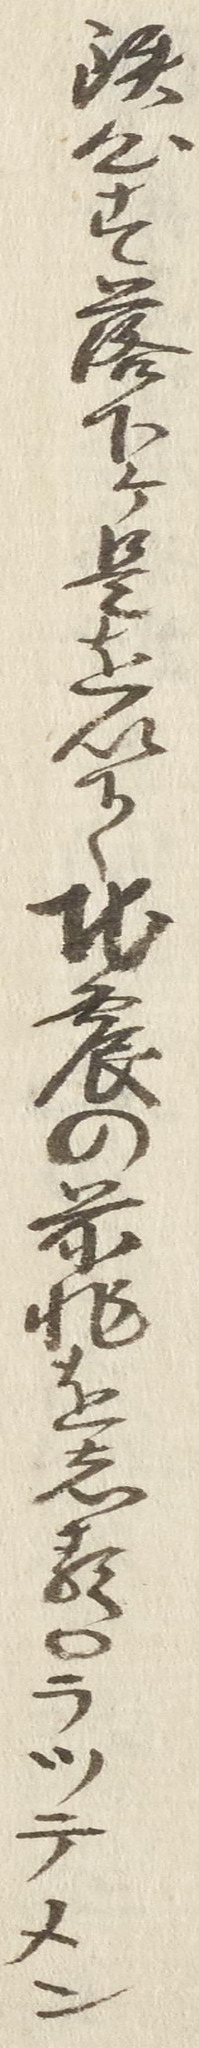鉄心す落下ケ是を以て地震の前兆をしる○ラツテメン
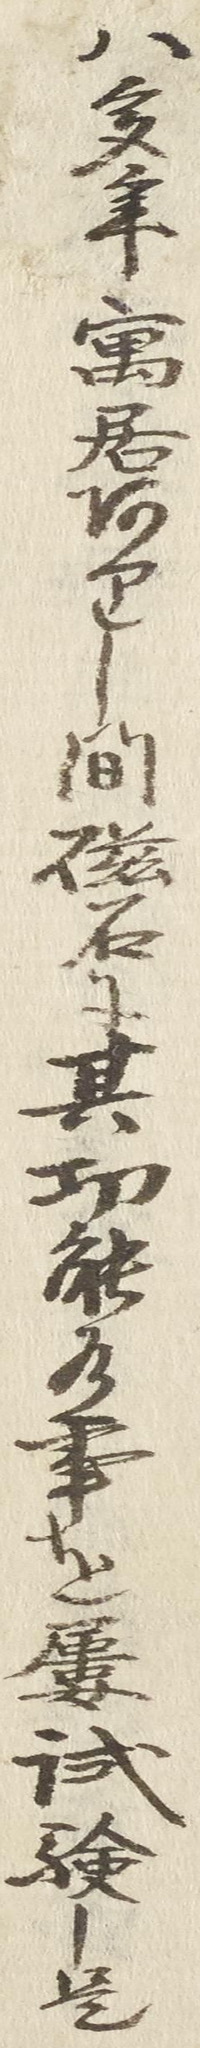は多年寓居ありし間磁石に其功能有事を屢試験し是
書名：従往古地震御届書記誌之一
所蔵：東京大学地震研究所図書室 Earthquake Research Institute Library, The University of Tokyo, JAPAN
